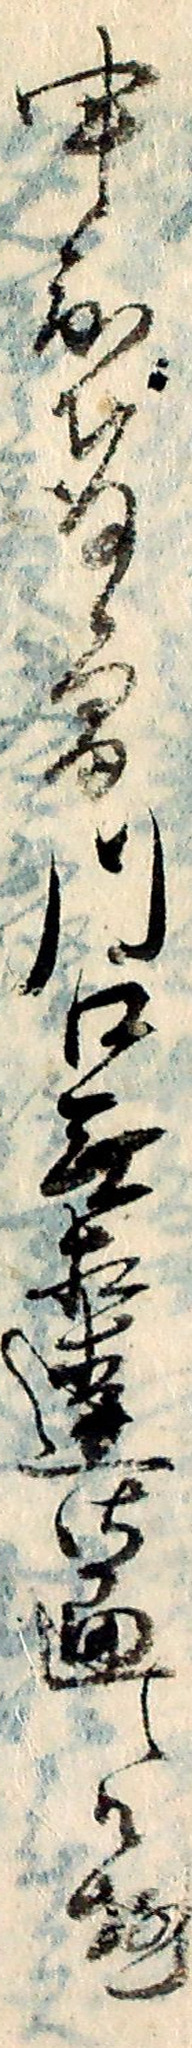申度奉存候間川口無相違御通し被遊
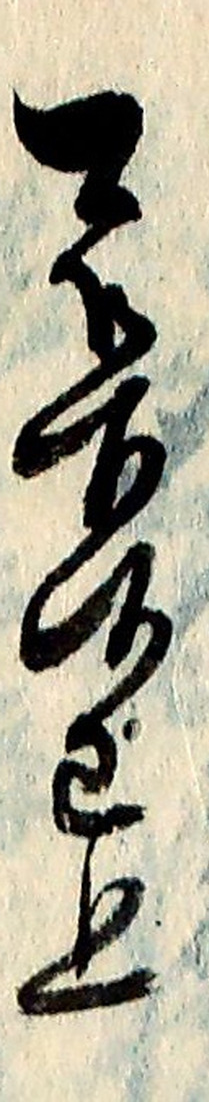可被下候已上
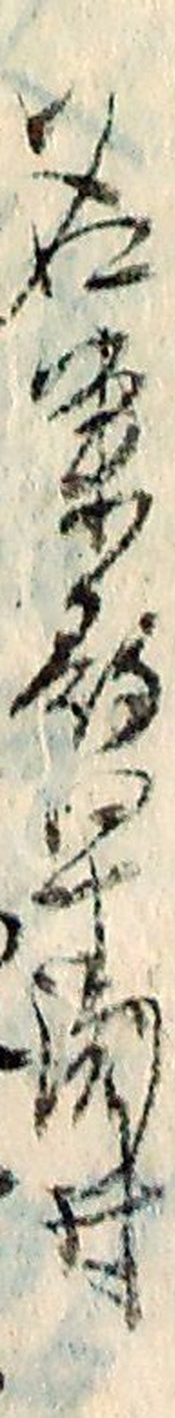名東郡早淵村
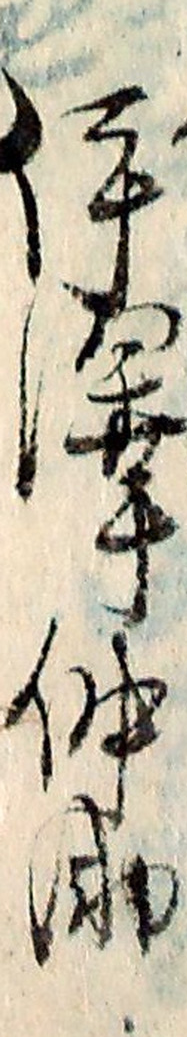伊沢仲助
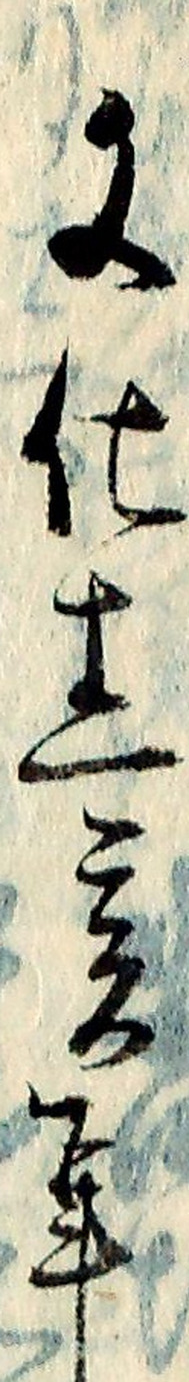文化十二亥年
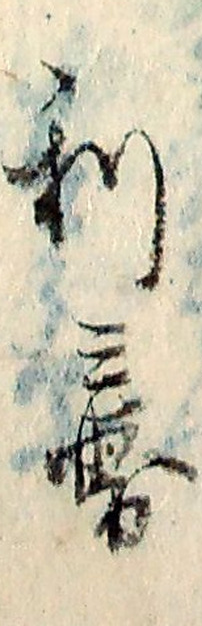利兵衛

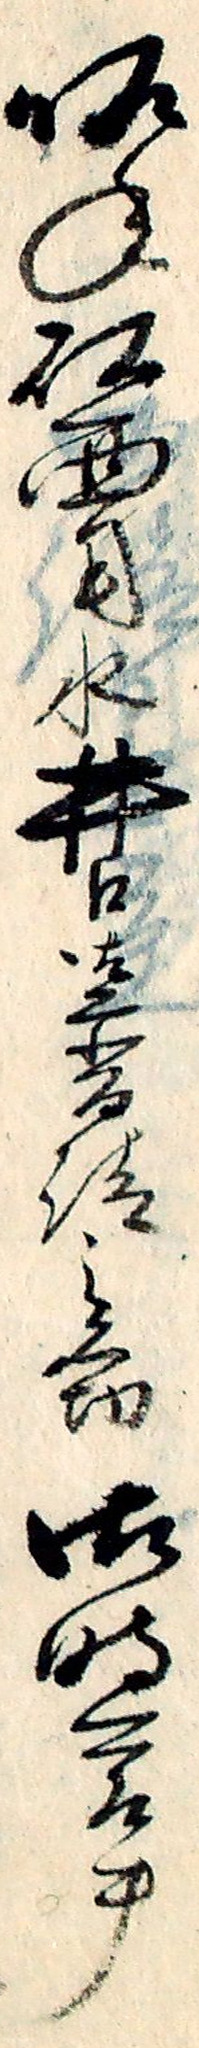昨年以西用水井口御普請之節御時節を
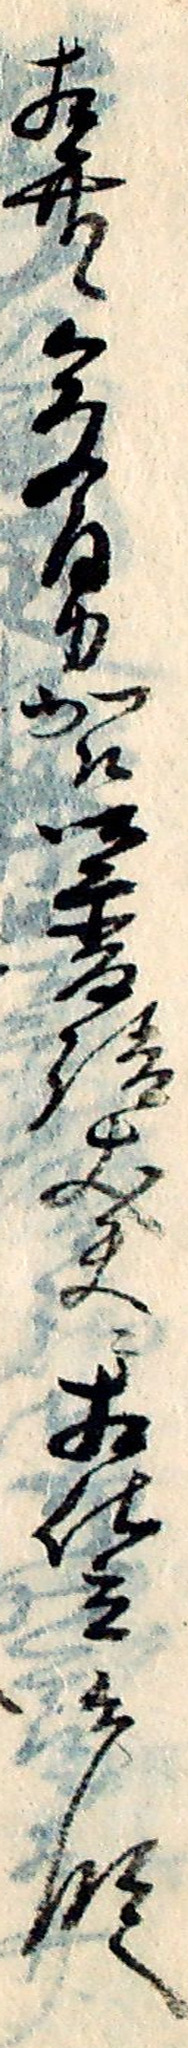相弁多自力加え御普請丈夫に相仕立候段
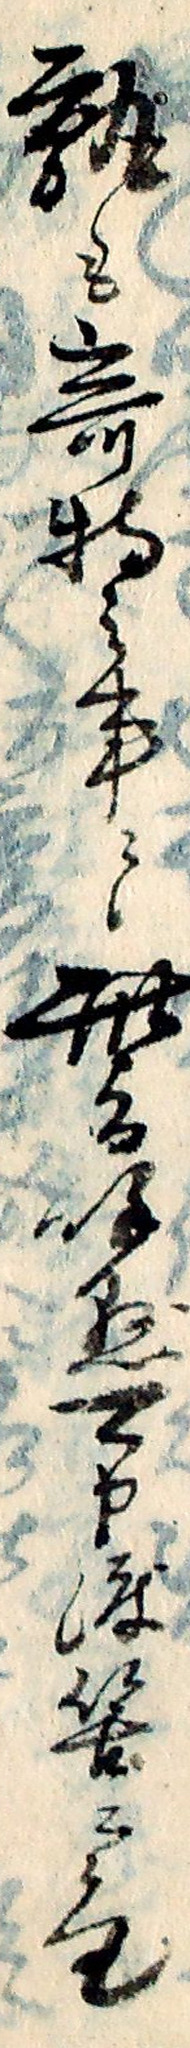孰も奇特之事に候此旨呼懸可申渡筈に候へ共
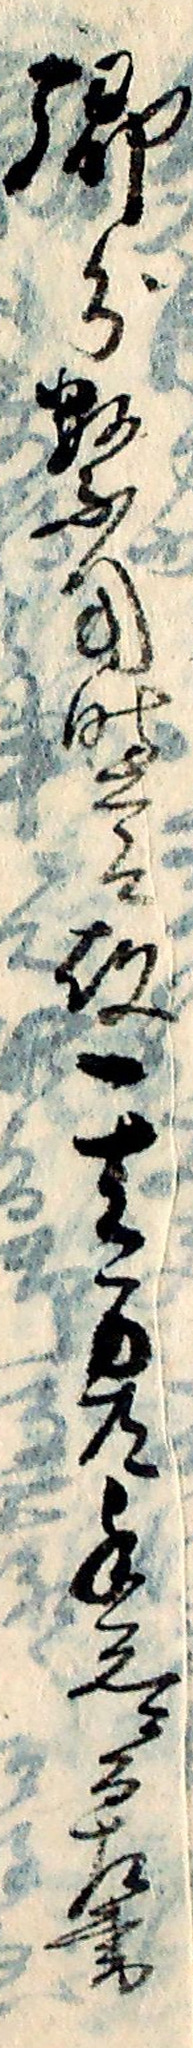郷分繁用時節故其方共手元にて左書
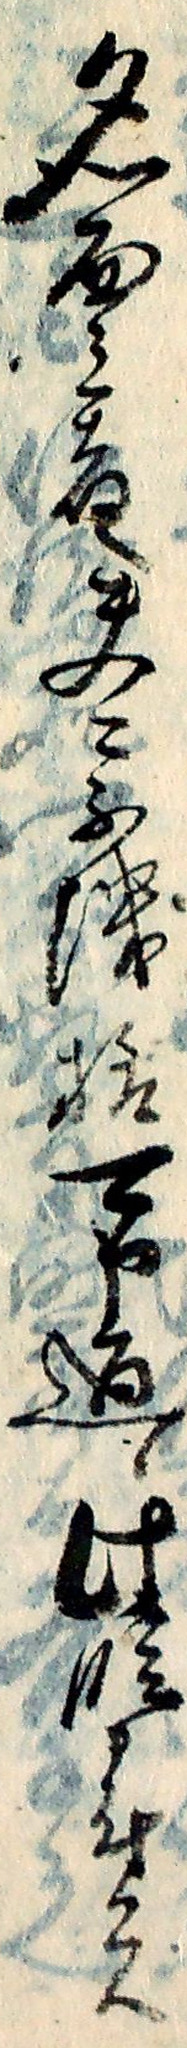名面之者へ夫々不洩様可申通候此段申付候以上
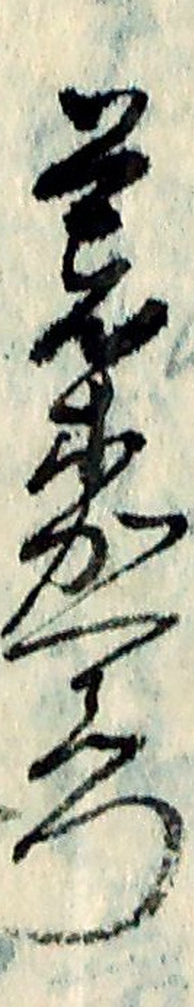荒木加一右衛門
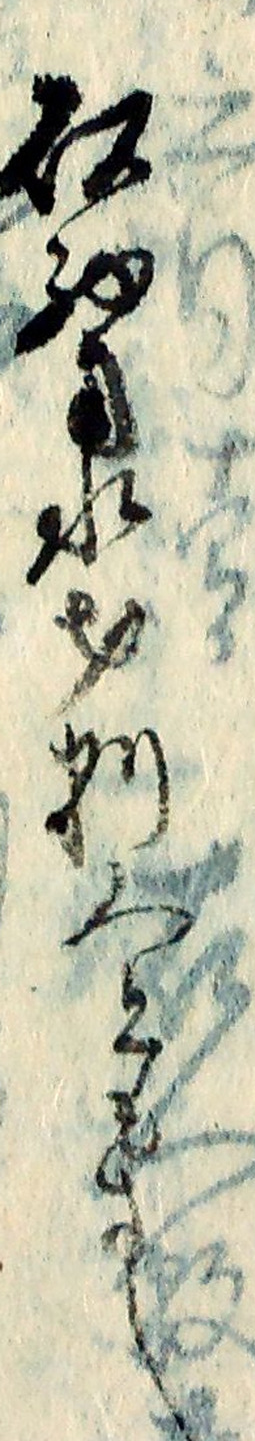以西用水才判人とも方へ
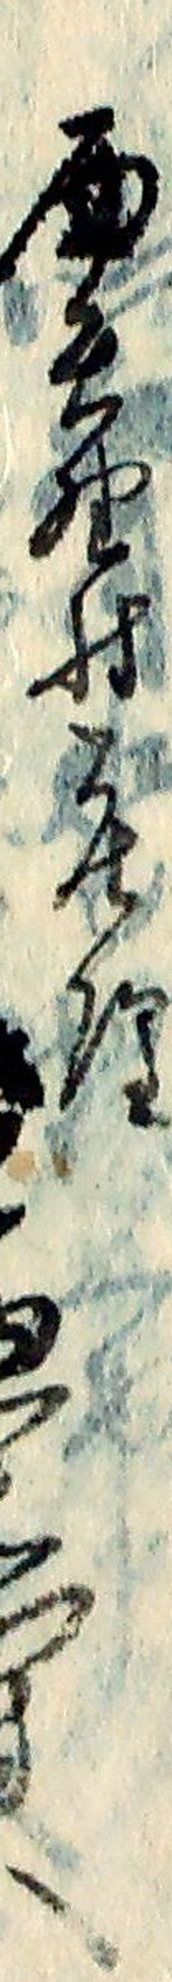西矢野村庄屋
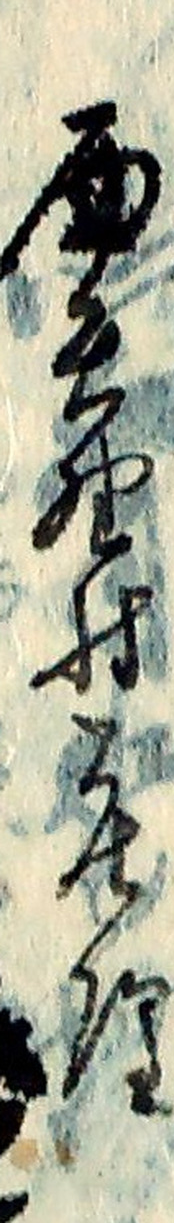西矢野村庄屋
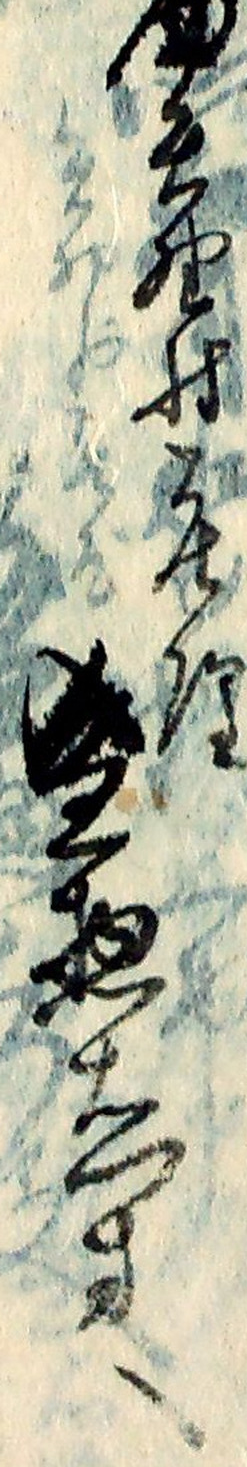盛惣右衛門方へ
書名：諸御願書控(後藤氏壱番）
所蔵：鳴門教育大学 Naruto University of Education
